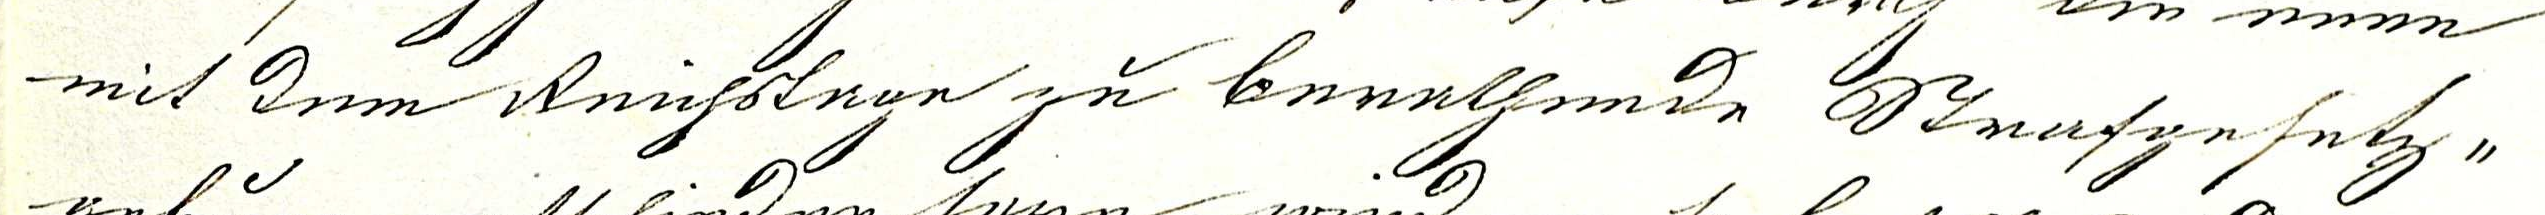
mit dem Reichstage zu berathende Strafgesetz¬
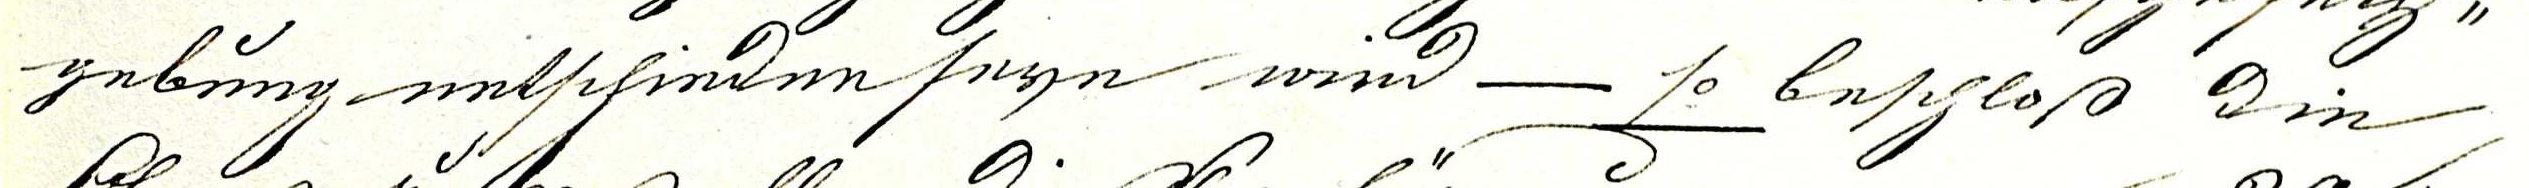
gebung entschieden seyn wird – so beschloß die
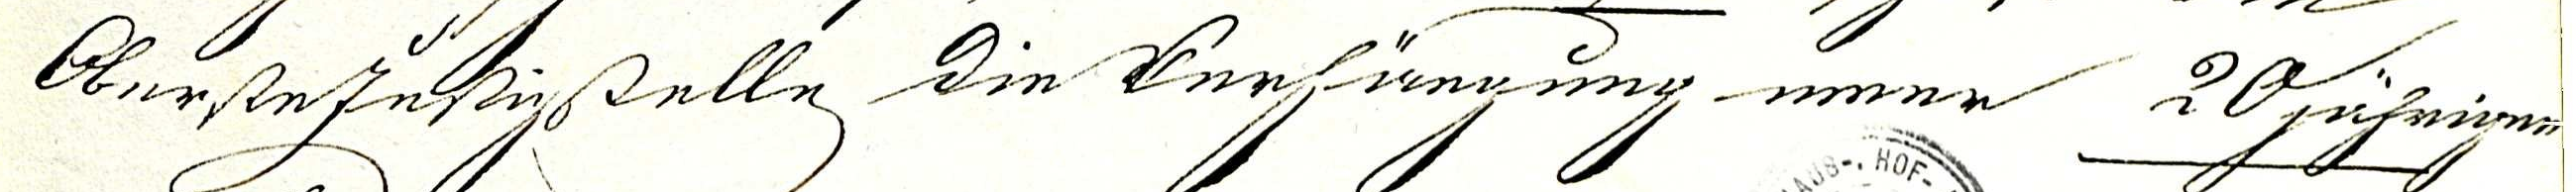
Oberste Justizstelle die Verhängung einer 20jährigen
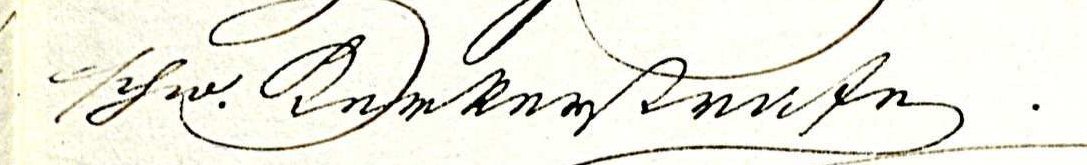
schw. Kerkerstrafe.
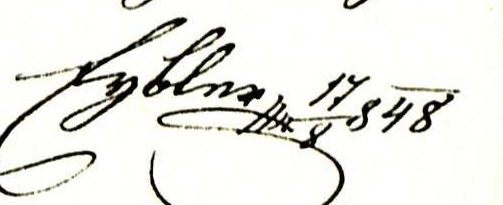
Eybler 17/8 [1]848
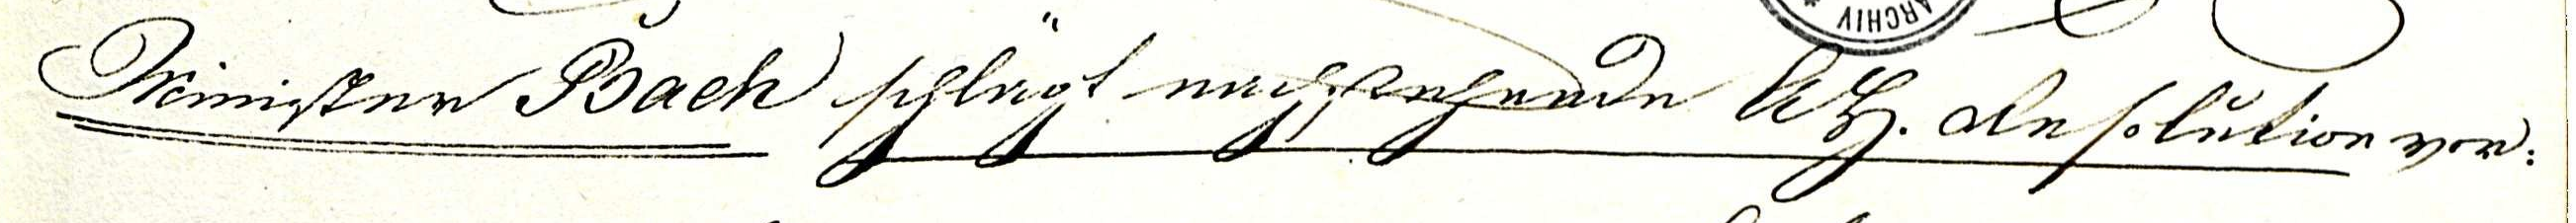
Minister Bach schlägt nachstehende AH. Resolution vor:
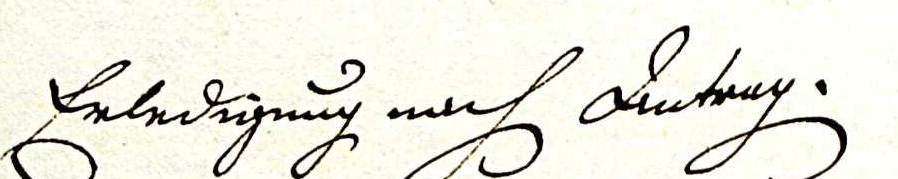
Erledigung nach Antrag
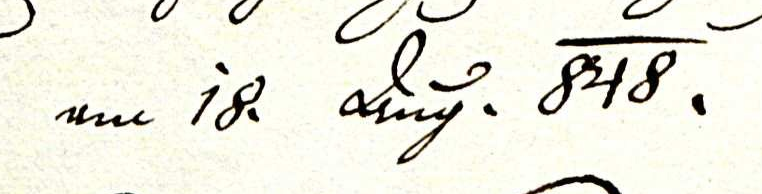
am 18. August [1]848
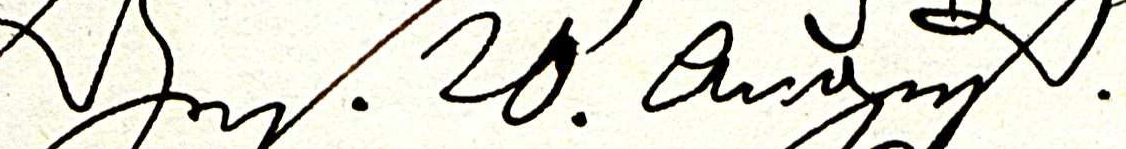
Ges. 20. August
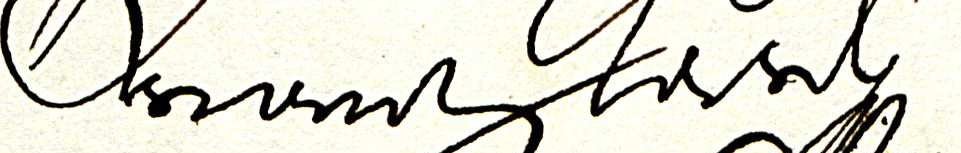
Franz Karl
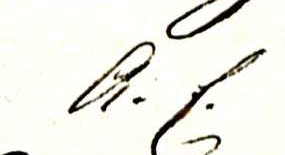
A.E.
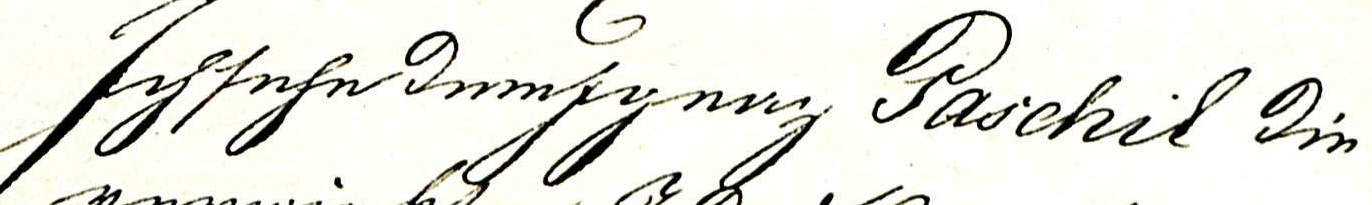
Ich sehe dem Ignaz Paschil die
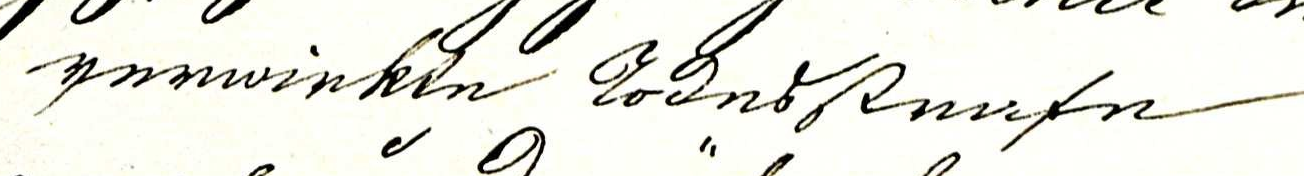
verwirkte Todesstrafe
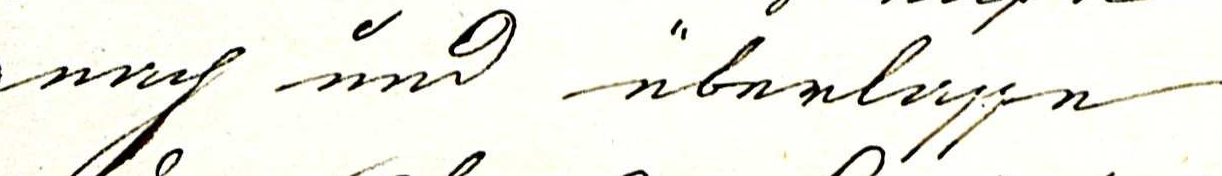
nach und überlasse
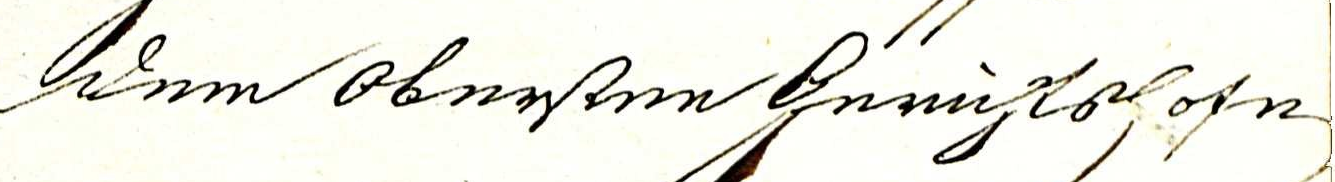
dem Obersten Gerichtshofe
